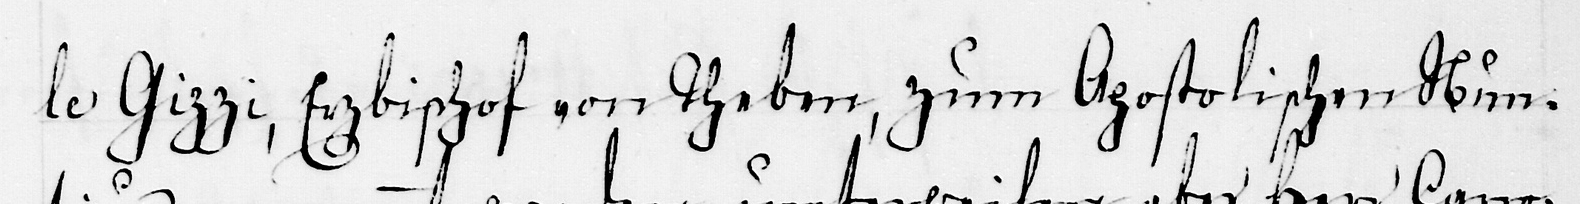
le Gizzi, Erzbischof von Theben, zum Apostolischen Nun¬
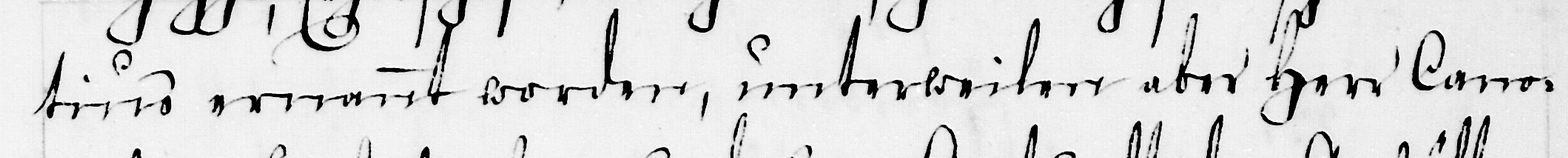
tius ernannt worden, unterweilen aber Herr Cano¬
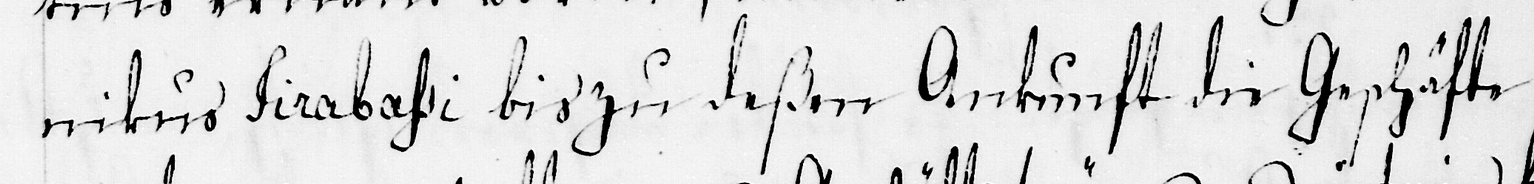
nikus Tirabassi bis zu deßen Ankunft die Geschäfte
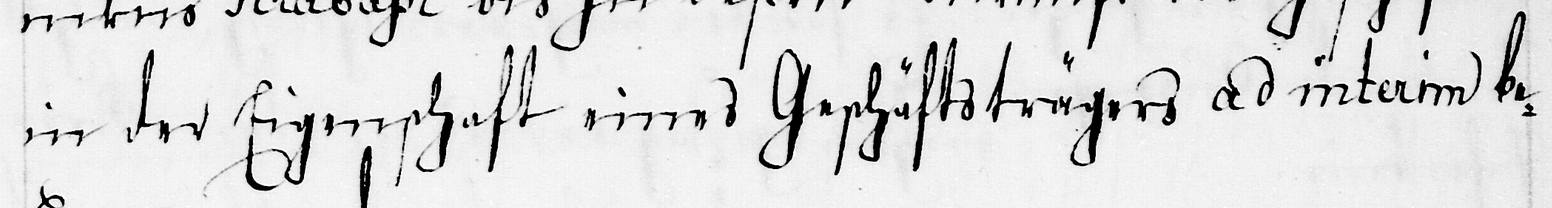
in der Eigenschaft eines Geschäftsträgers ad interim be¬
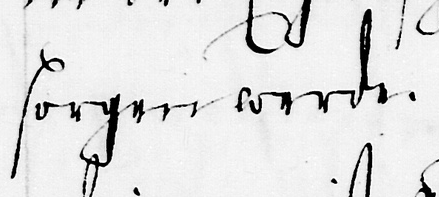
sorgen werde.
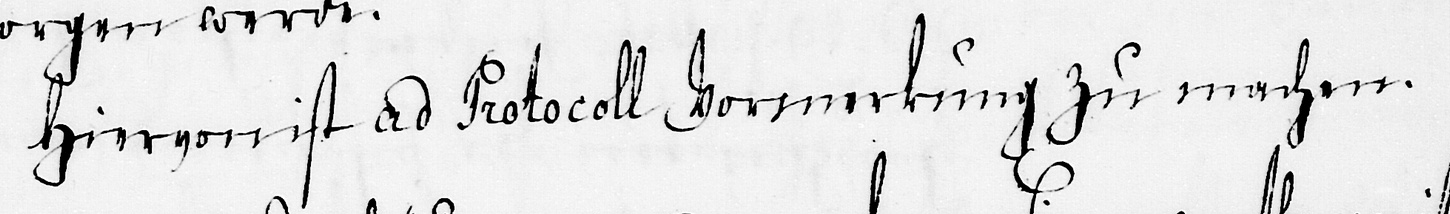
Hiervon ist ad Protocoll Vormerkung zu machen.
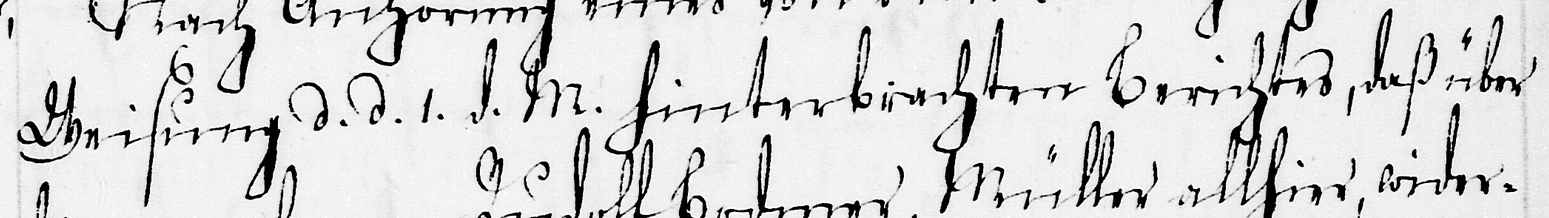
Weisung d. d. 1. d. M. hinterbrachten Berichtes, daß über
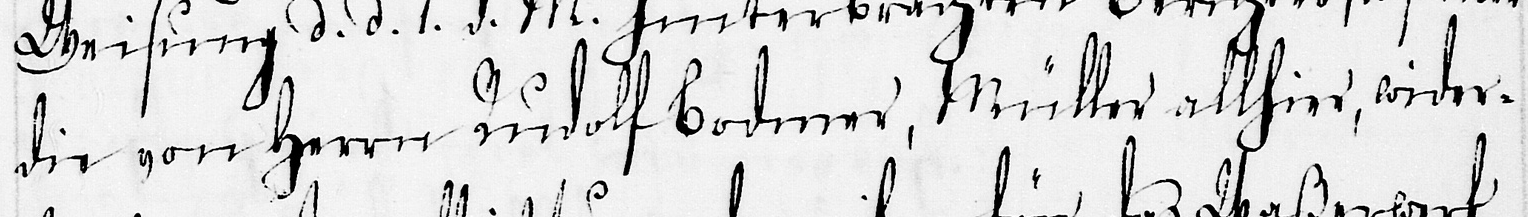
die von Herrn Rudolf Bodmer, Müller allhier, wider¬
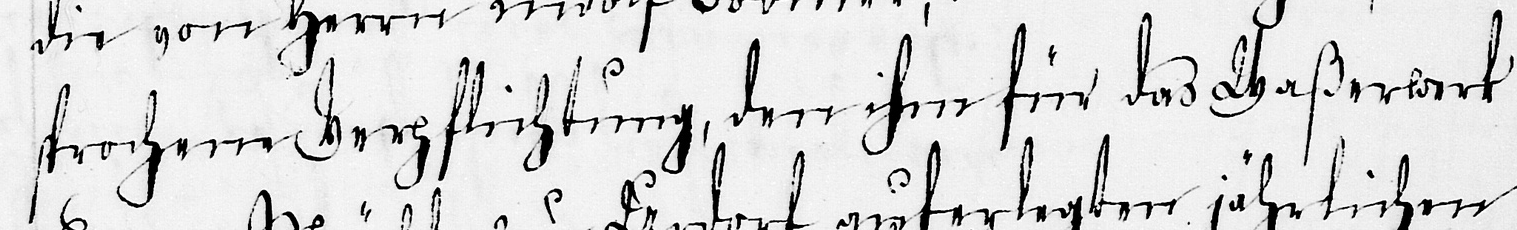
sprochene Verpflichtung, den ihm für das Waßerwerk
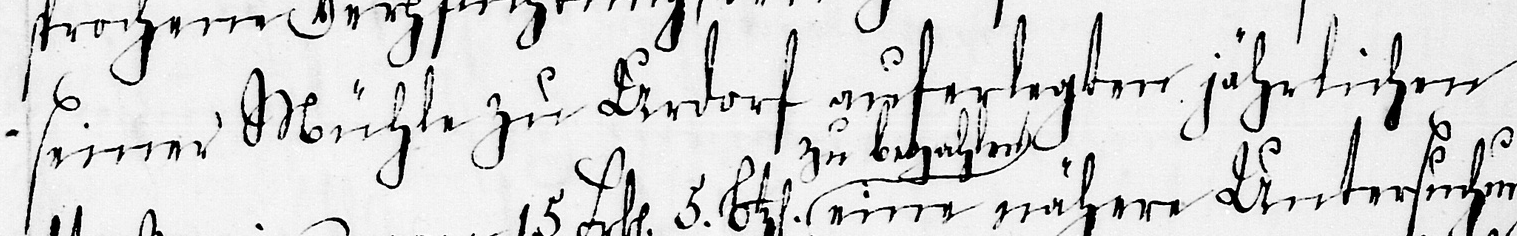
seiner Mühle zu Urdorf auferlegten jährlichen
